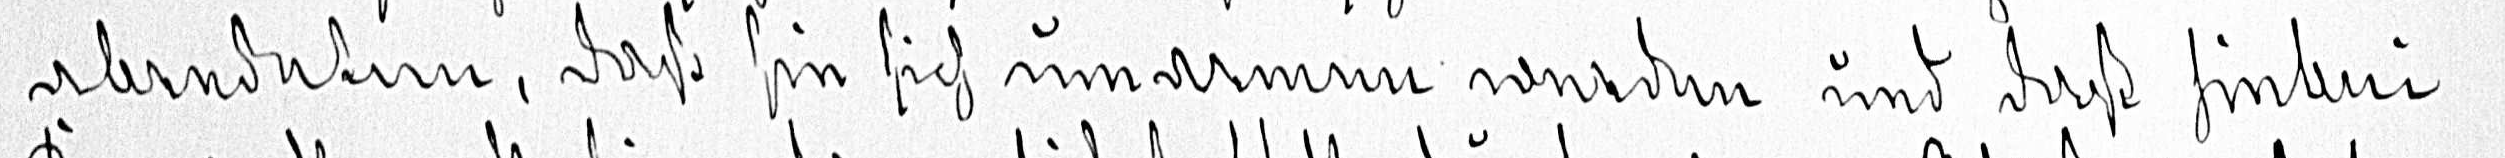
er nach reifer Überlegung und mit der festen Absicht, die
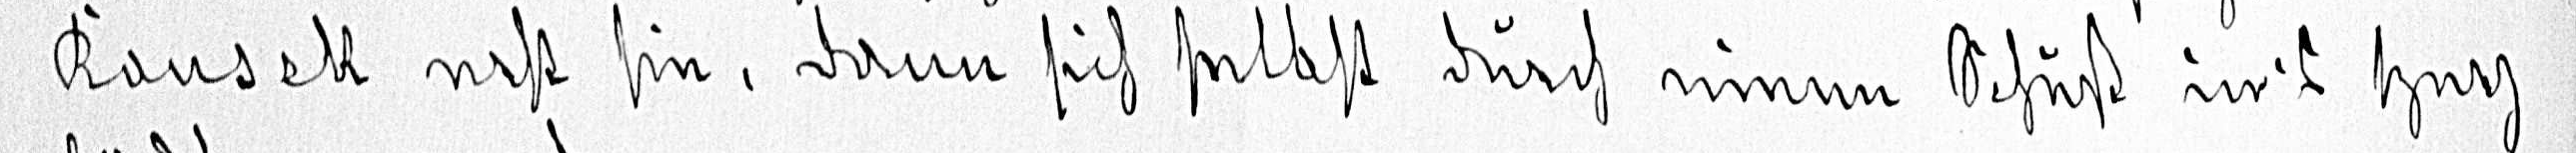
Kafka zu tödten, abgefeuert.
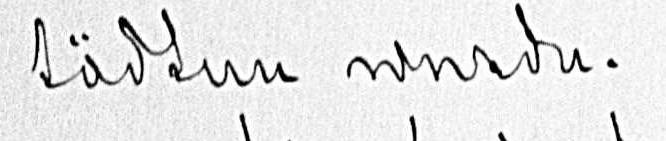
Nun hätte er auch sich selbst erschießen sollen; fünf¬
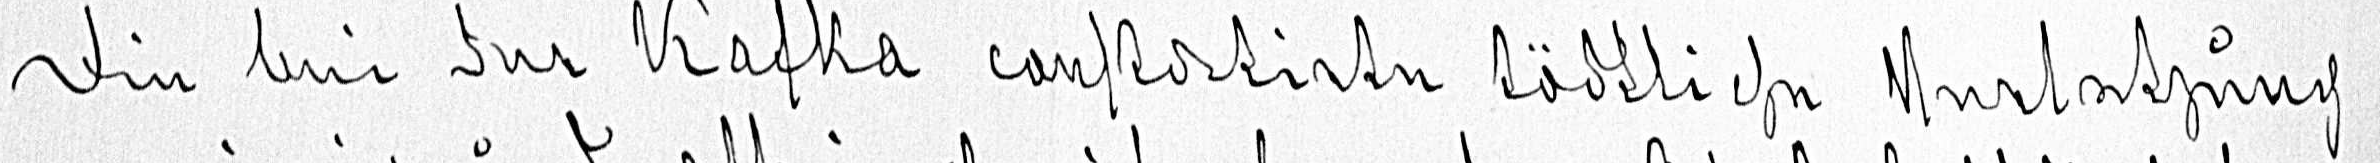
oder sechsmal setzte er den Revolver in der Herzgegend
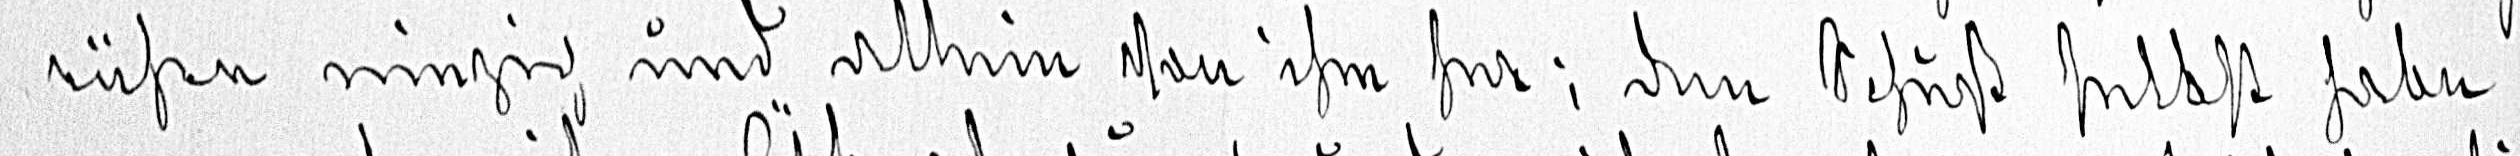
an, hatte jedoch nicht so viel Kraft und Muth, den drücken
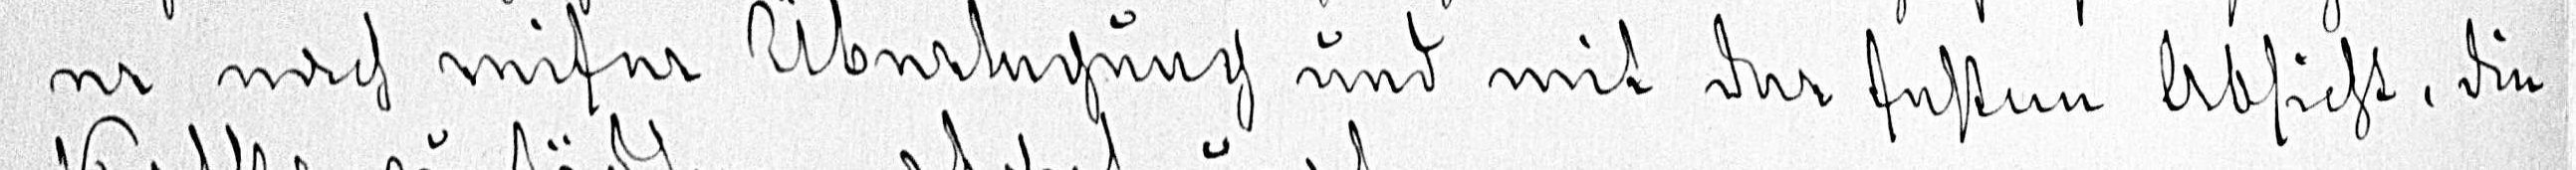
zu berühren.
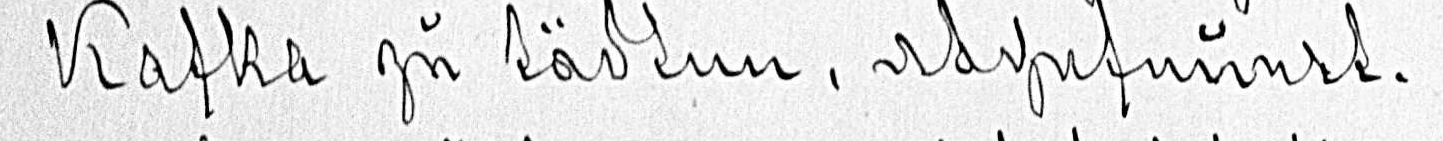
Er blieb hierauf nach etwa 2 Stunden bei der Leiche
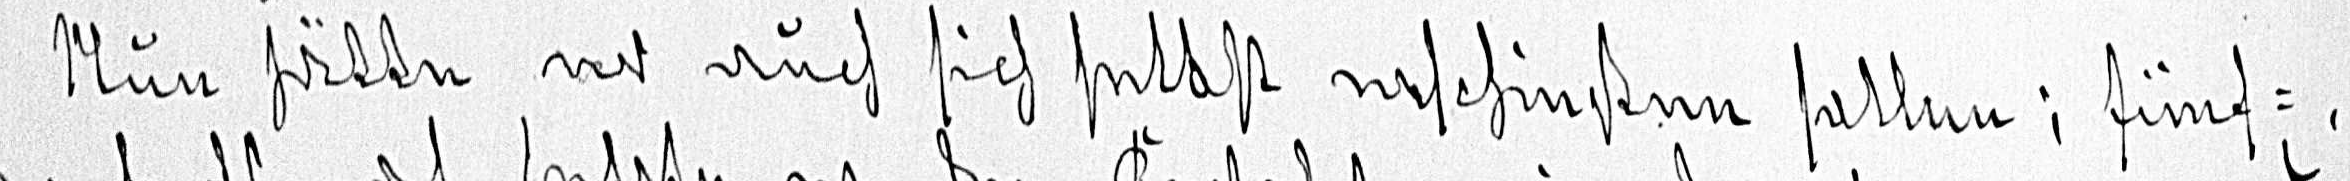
und begab sich dann, unter Mitnahme des Revolvers, nach
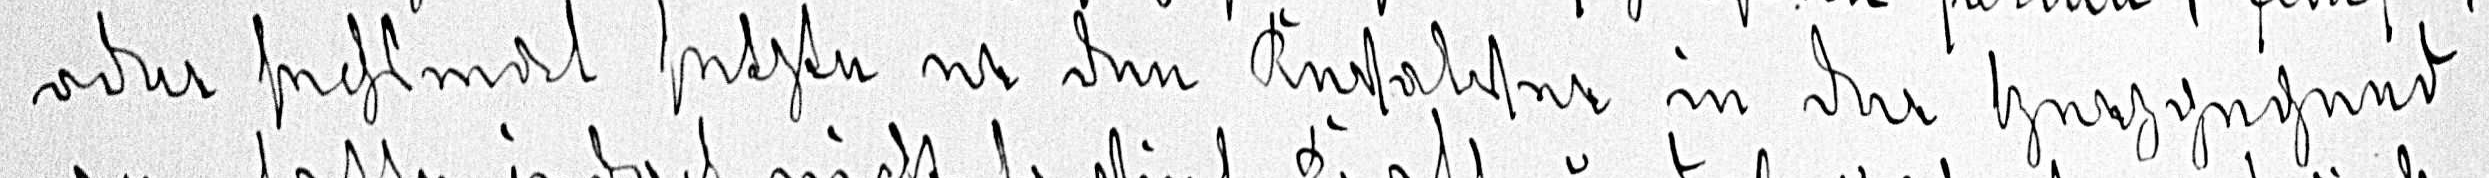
Zlič, wo er sich in dem Magazin der Bleiche seines On¬
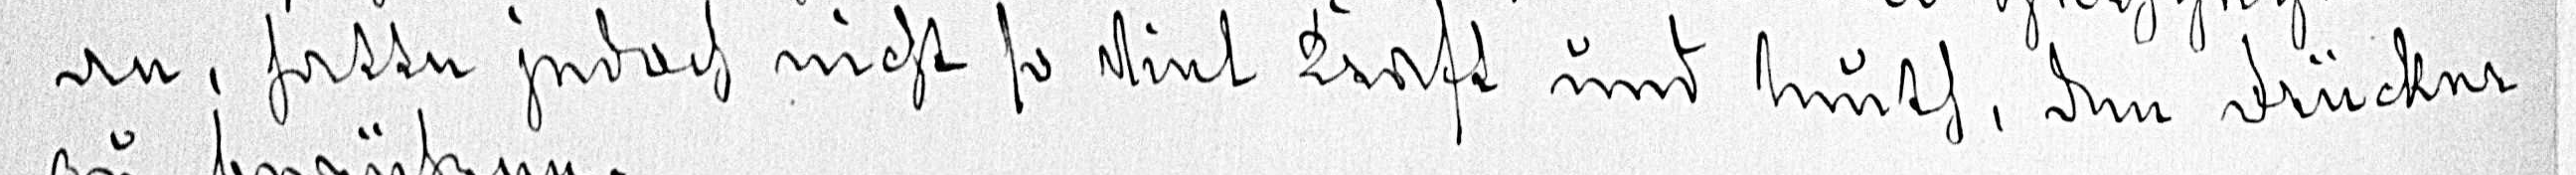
kels verbarg.
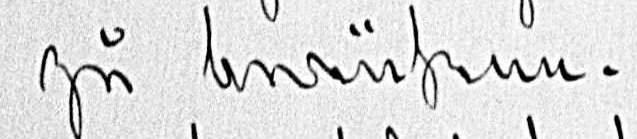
Das Gutachten der Sachverständigen, die Lage der Lei¬
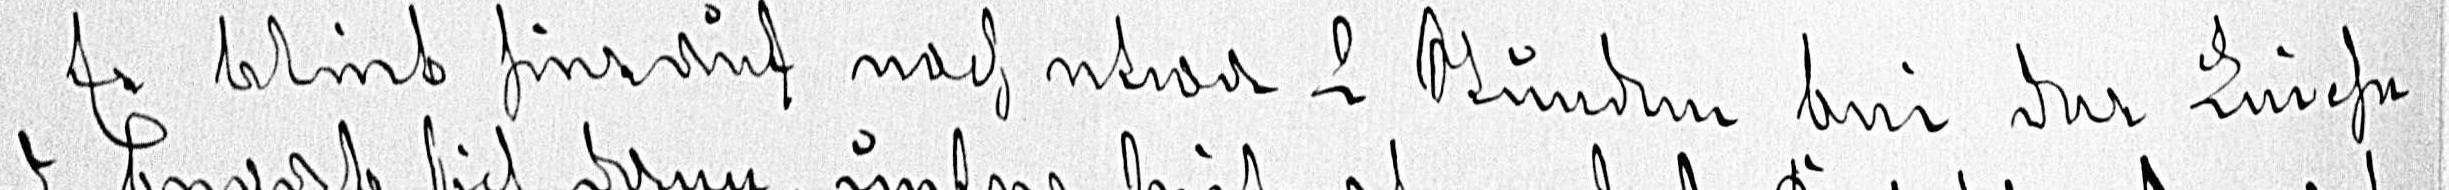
che und insbesondere der letzte Brief der Kafka, welcher
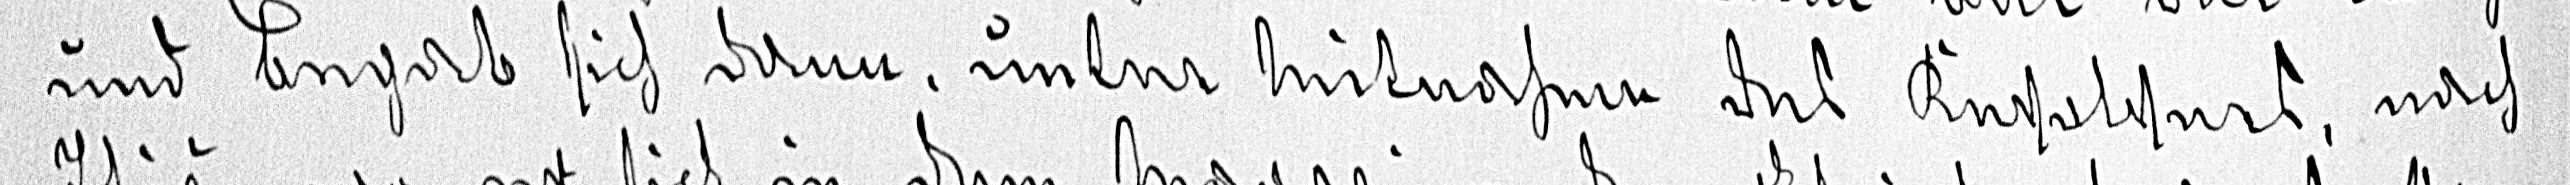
am Thatorte zerrissen aufgefunden und zusammengesetzt
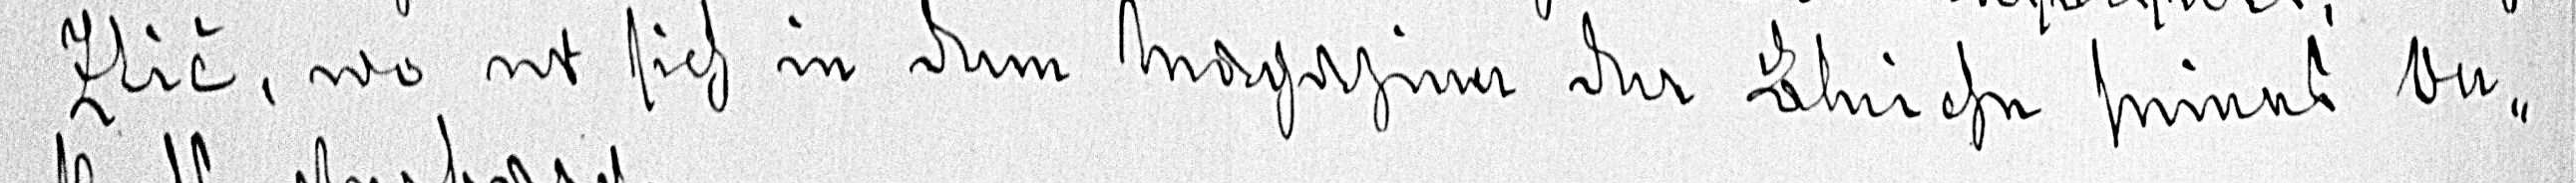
wurde, spricht – übereinstimmend mit der Aussage des
